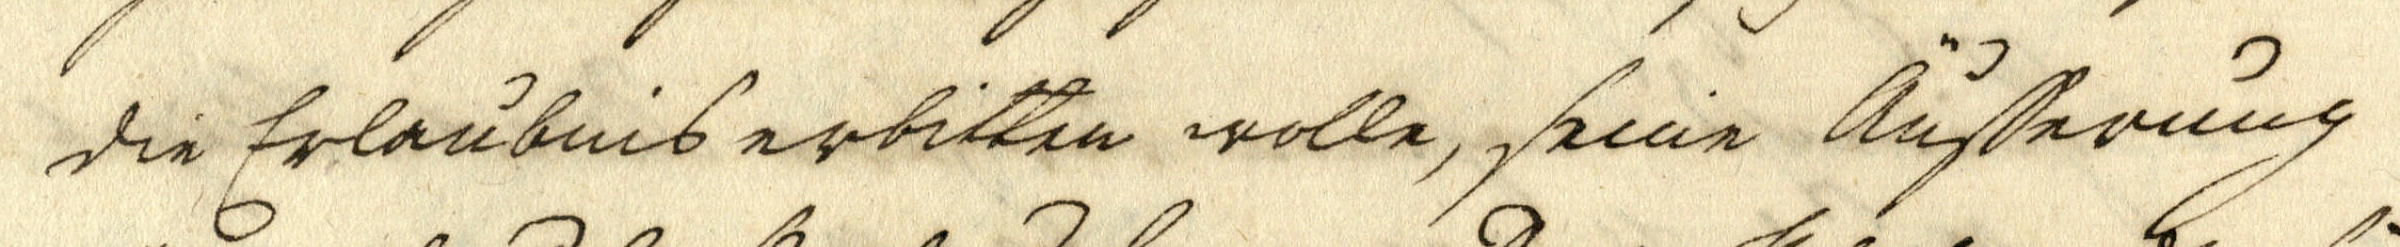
die Erlaubnis erbitten wolle, seine Äusserung
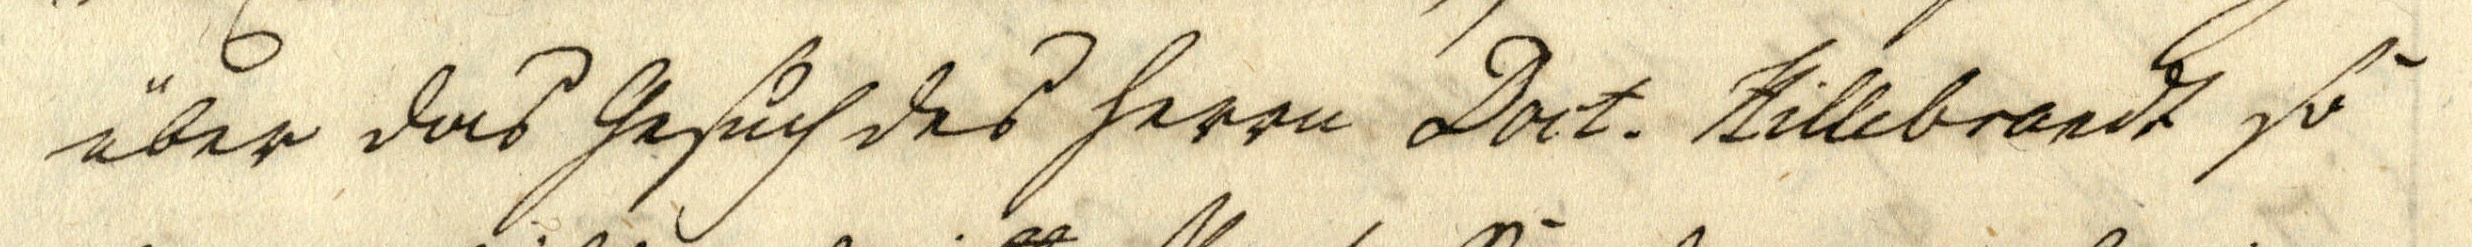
über das Gesuch des Herrn Doct. Hillebrandt so
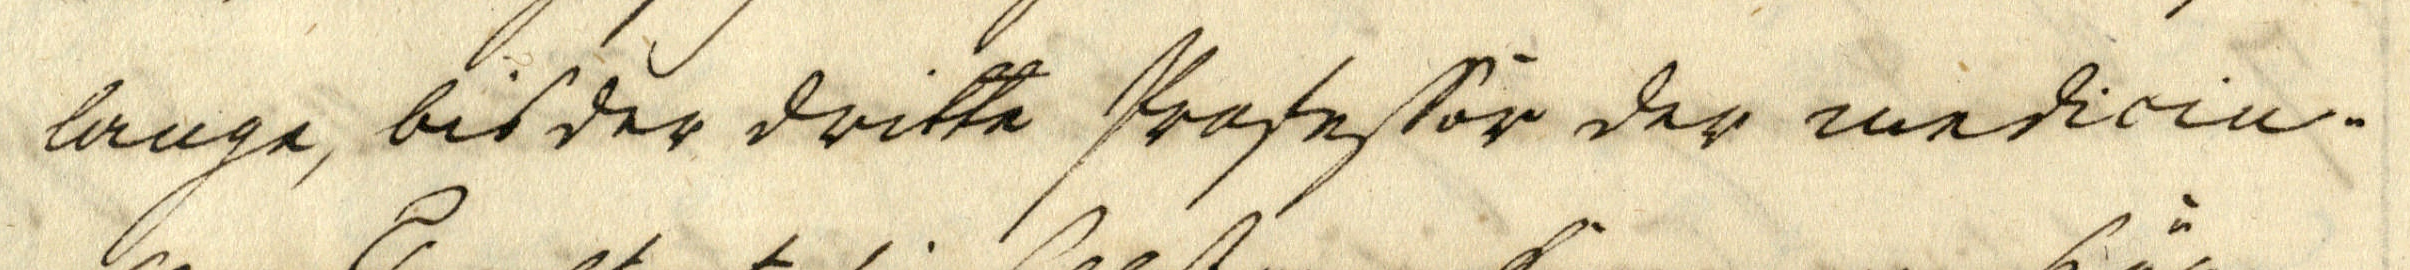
lange, bis der dritte Professor der medicin-
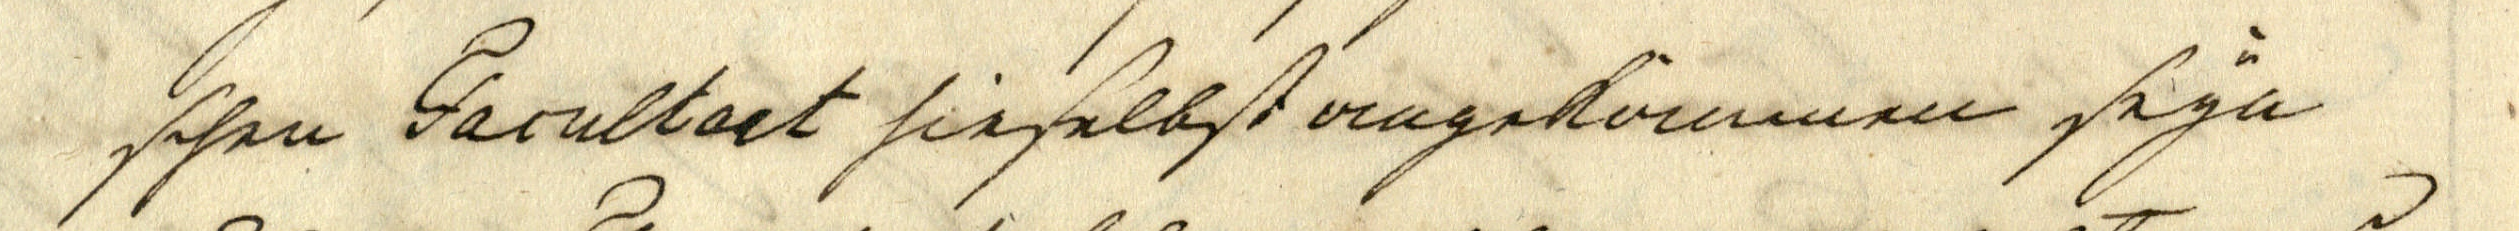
schen Facultaet hieselbst angekommen seyn
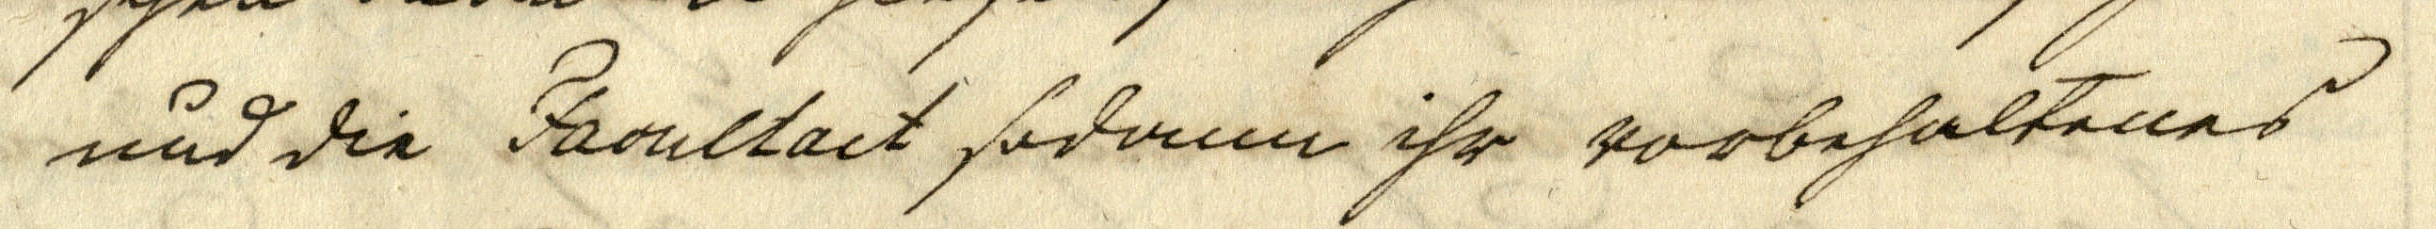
und die Facultaet sodann ihr vorbehaltenes
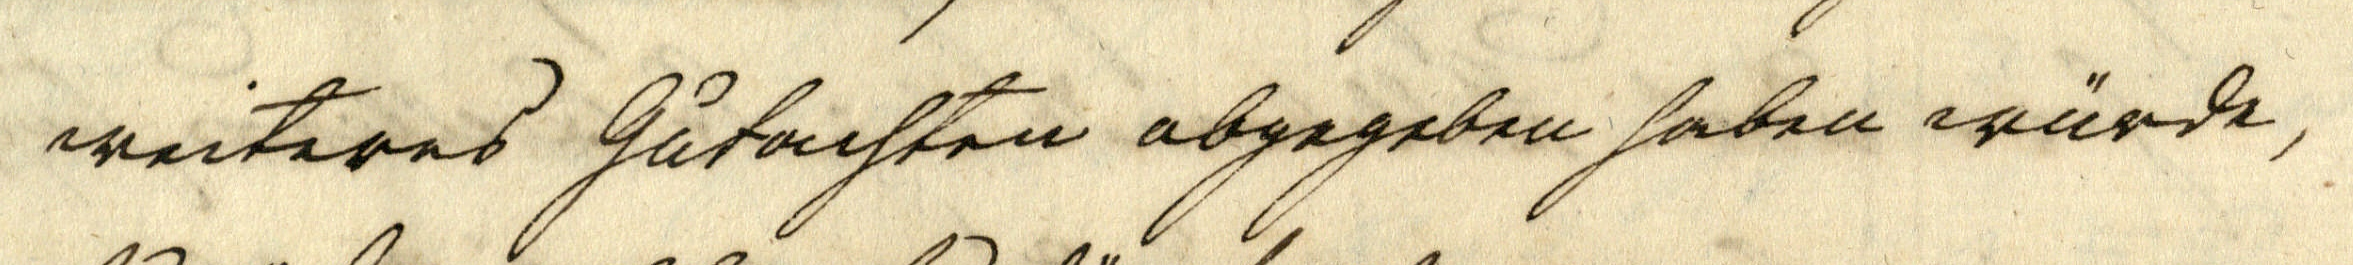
weiteres Gutachten abgegeben haben würde,
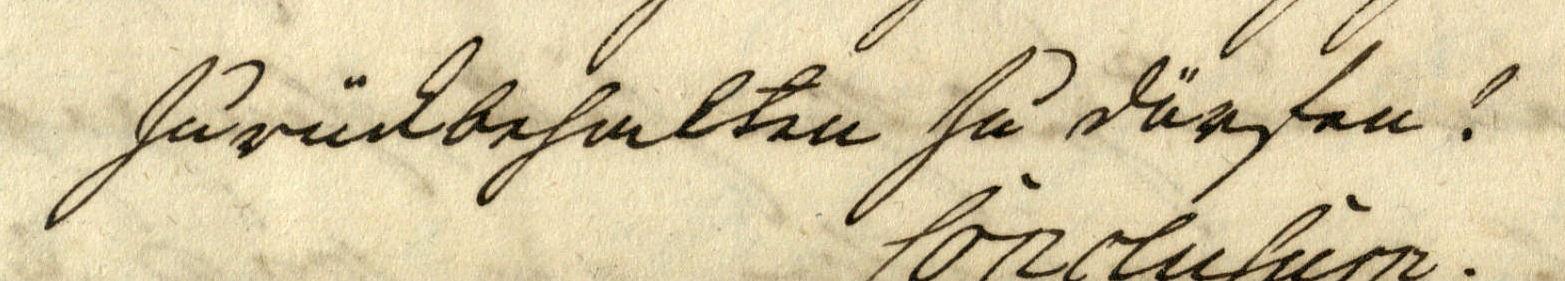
zurückbehalten zu dürfen?
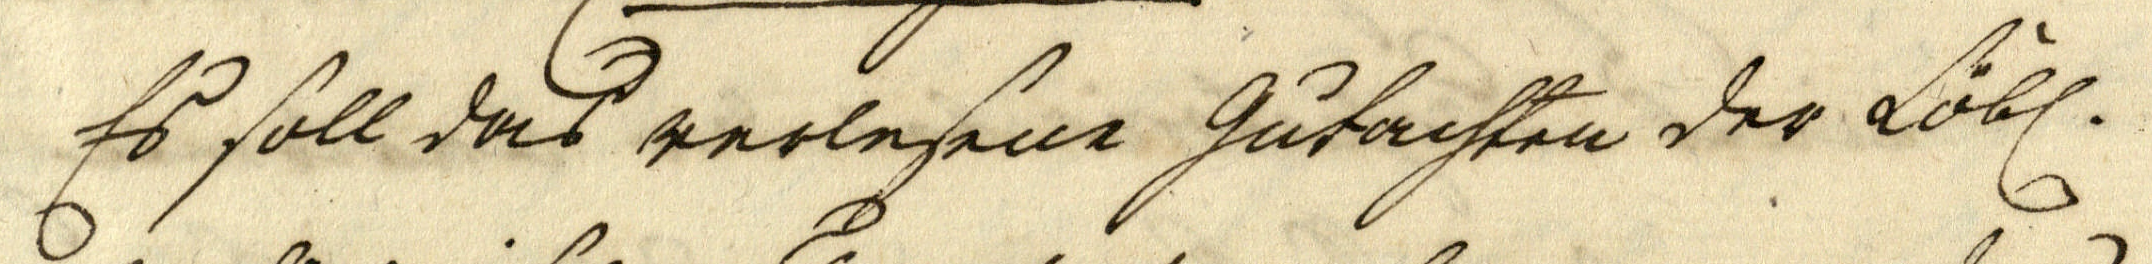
Es soll das verlesene Gutachten der Löbl.
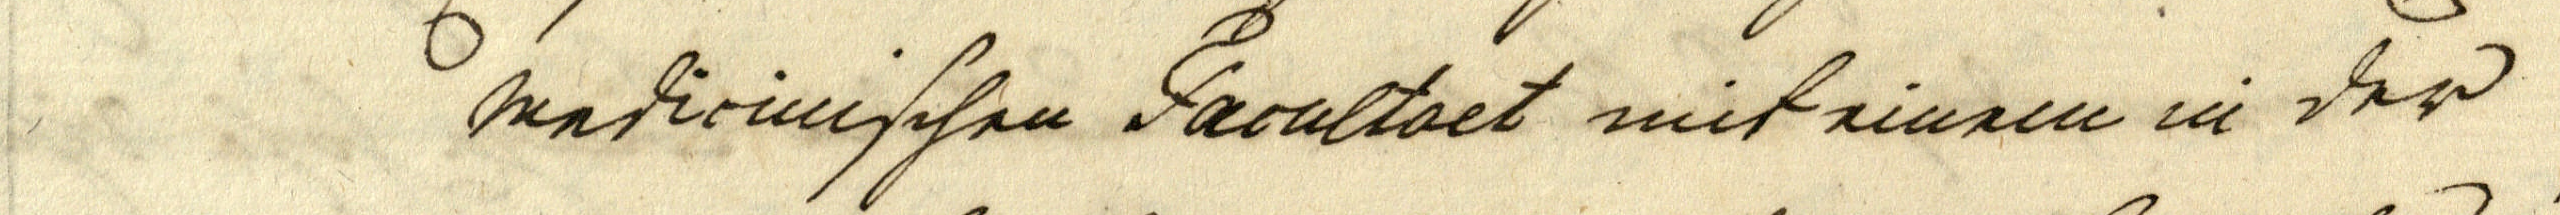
Medicinischen Facultaet mit einem in der
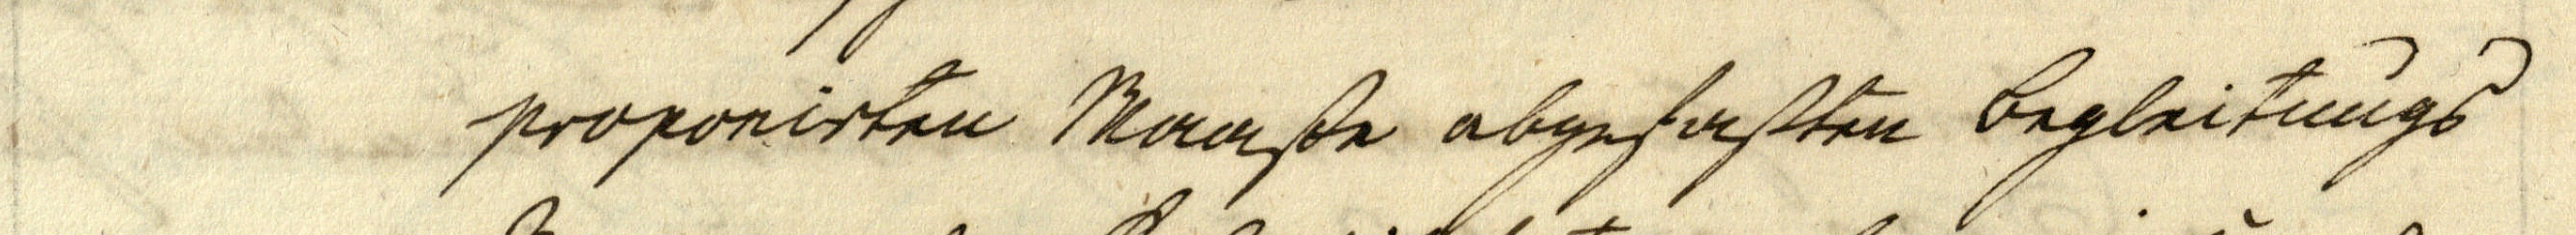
proponirten Maaße abgefaßten Begleitungs
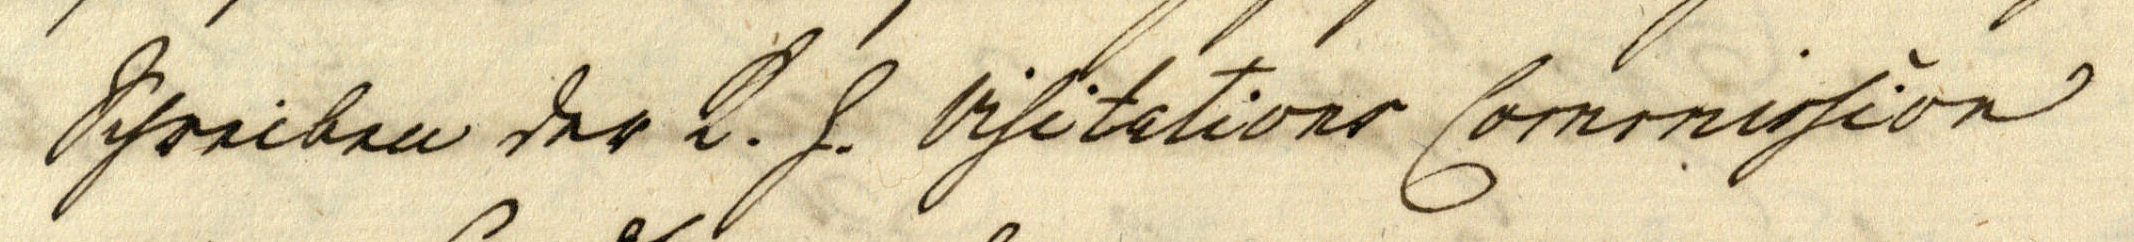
Schreiben der K. h. Visitations Commisison
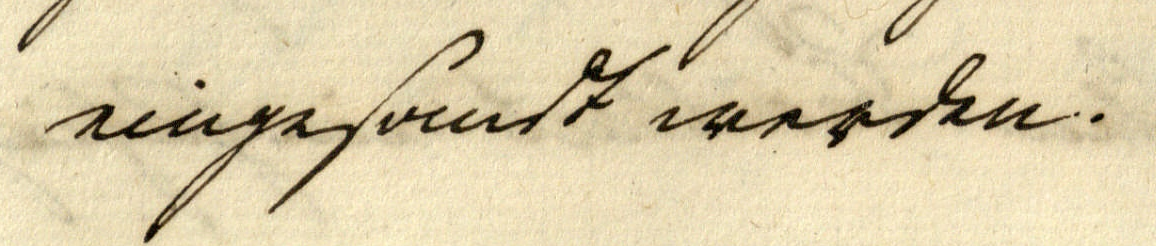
eingesandt werden.
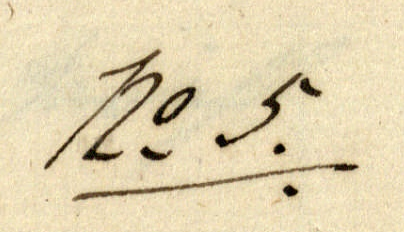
No 5.
